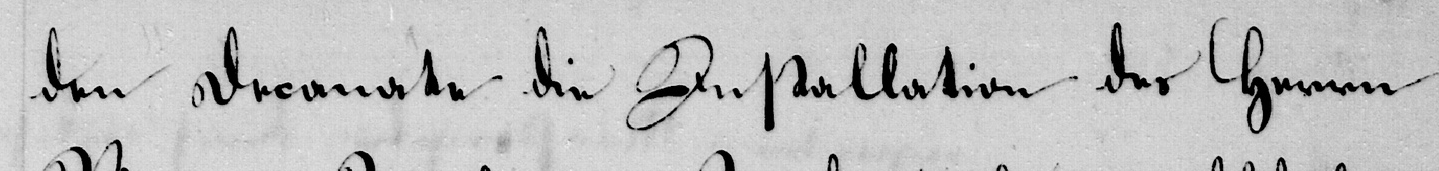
den Decanate die Installation des Herrn
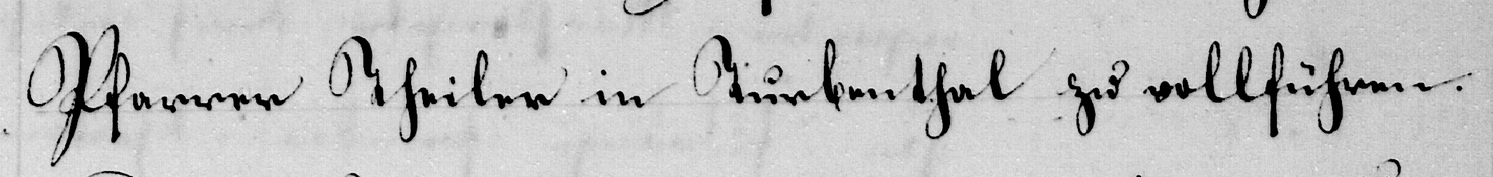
Pfarrer Theiler in Turbenthal zu vollführen.
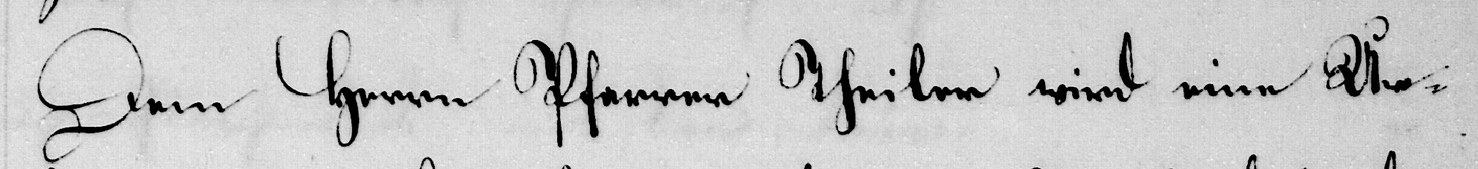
Dem Herrn Pfarrer Theiler wird eine Ur¬
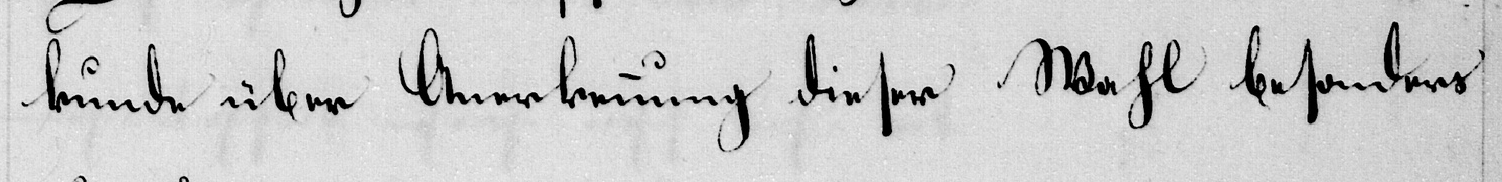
kunde über Anerkennung dieser Wahl besonders
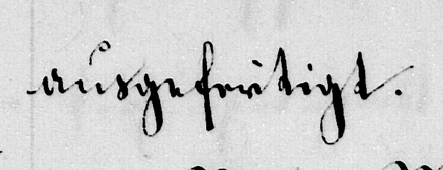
ausgefertigt.
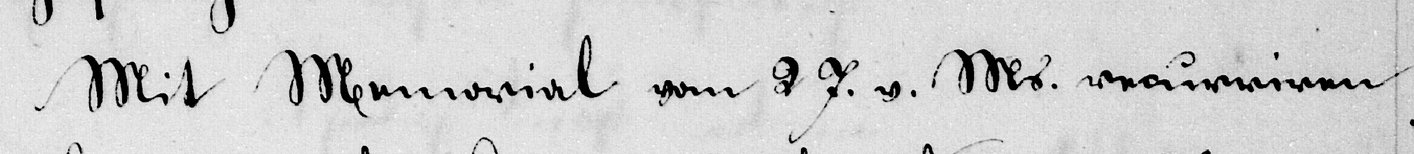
Mit Memorial vom 27. v. Ms. recurriren
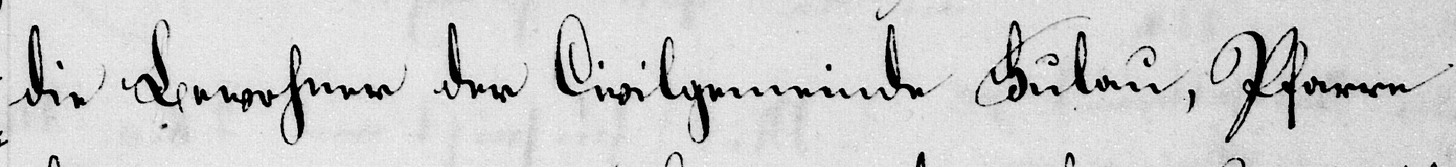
die Bewohner der Civilgemeinde Fulau, Pfarre
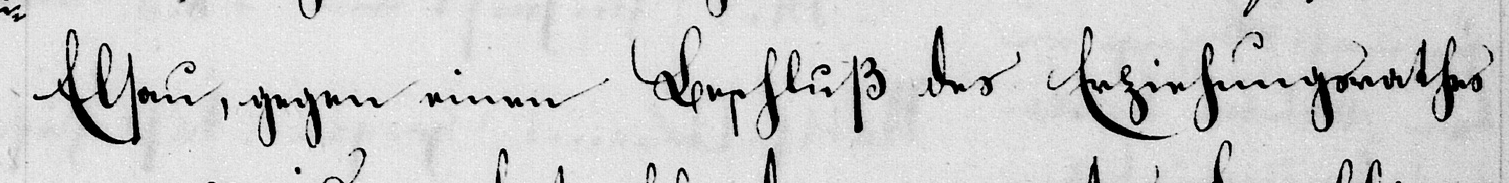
Elsau, gegen einen Beschluß des Erziehungsrathes
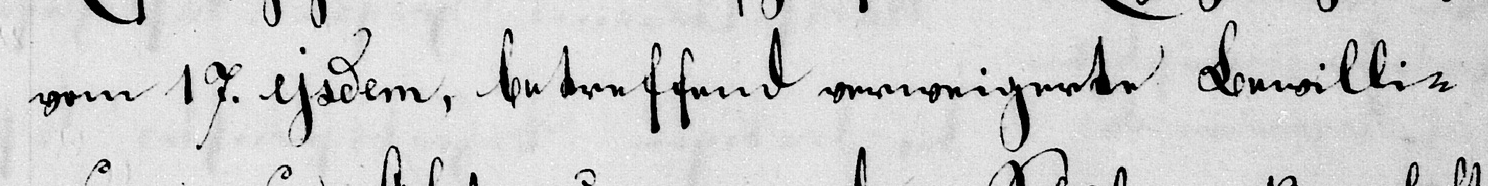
vom 17. ejsdem, betreffend verweigerter Bewilli¬
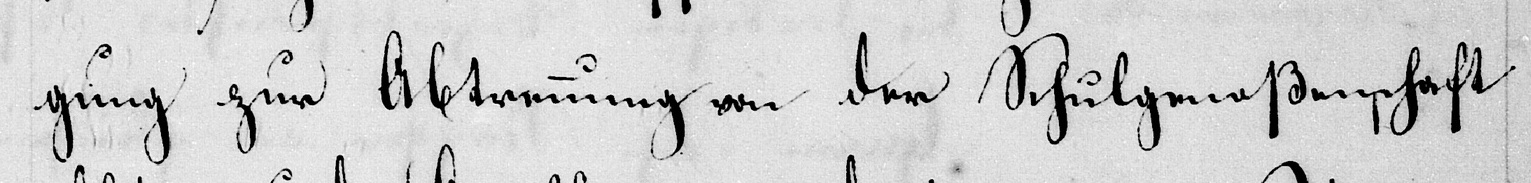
gung zur Abtrennung von der Schulgenoßenschaft
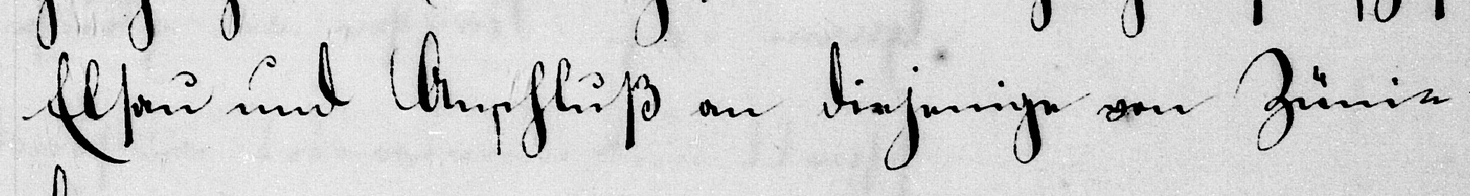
Elsau und Anschluß an diejenige von Züni¬
